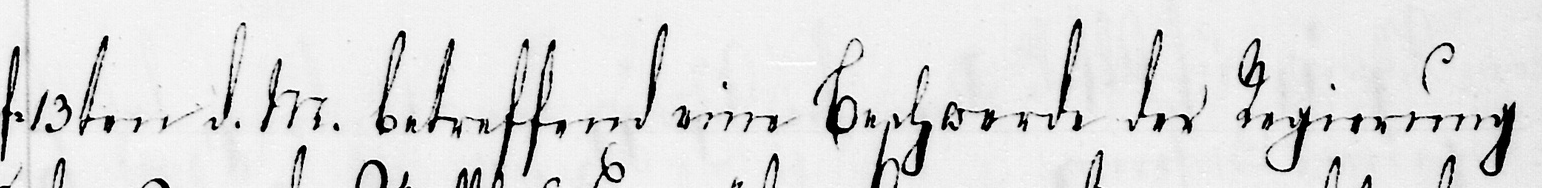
13ten d. M. betreffend eine Beschwerde der Regierung
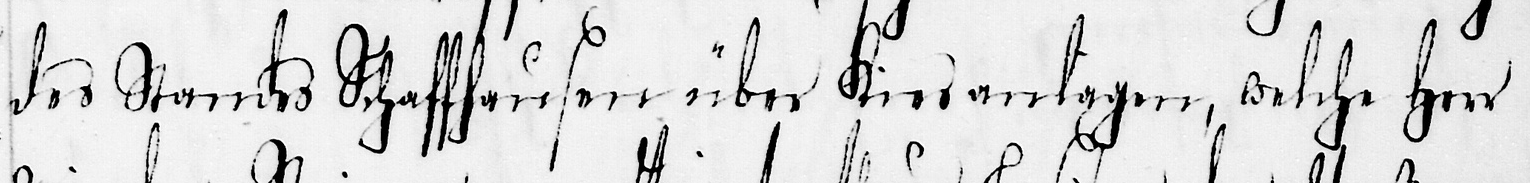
des Standes Schaffhausen über Kiesanlagen, welche Herr
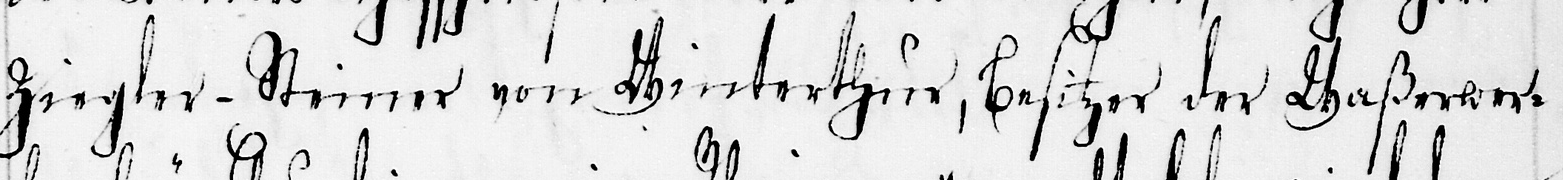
Ziegler-Steiner von Winterthur, Besitzer der Waßerwer¬
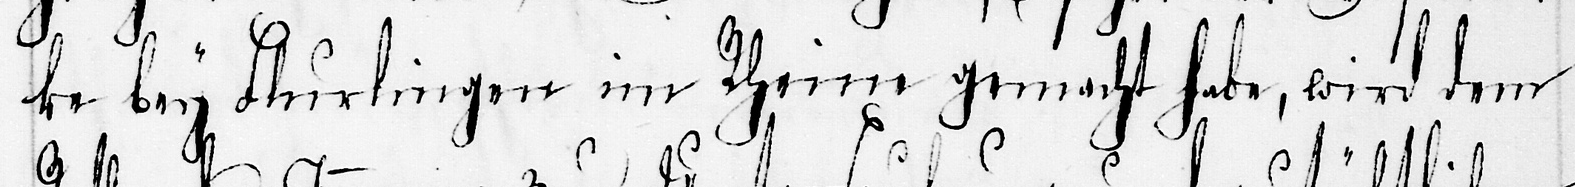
ke bey Flurlingen im Rheine gemacht habe, wird dem
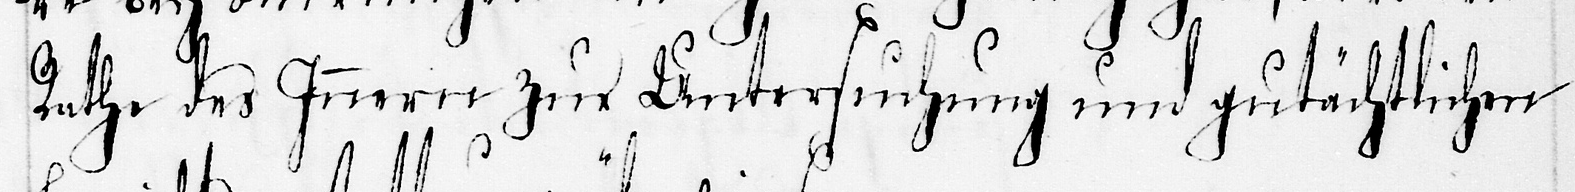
Rathe des Innern zur Untersuchung und gutächtlichen
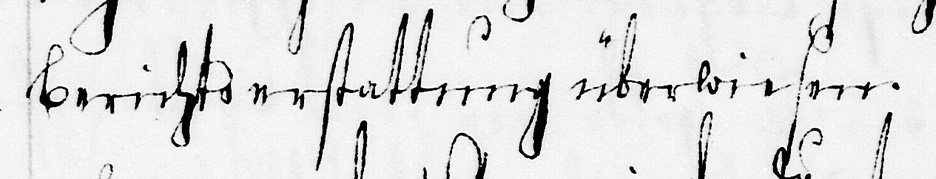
Berichtserstattung überwiesen.
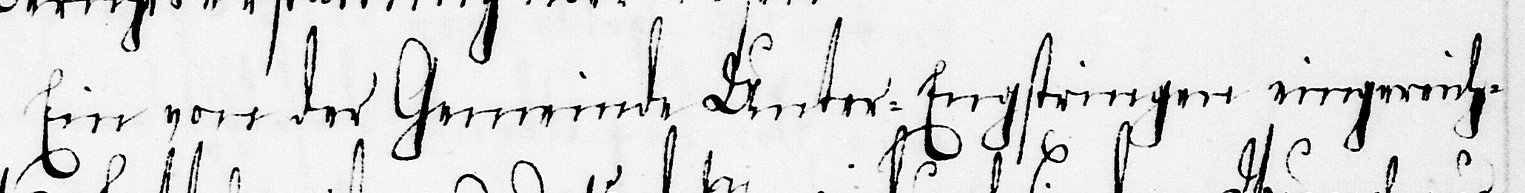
Ein von der Gemeinde Unter-Engstringen eingereich¬
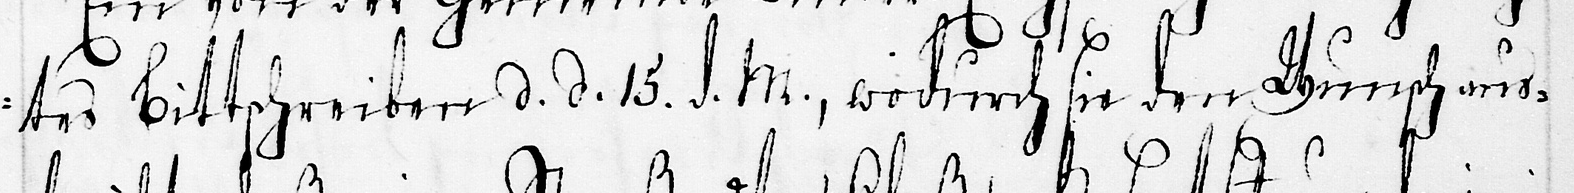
tes Bittschreiben d. d. 15. d. M., wodurch sie den Wunsch aus¬
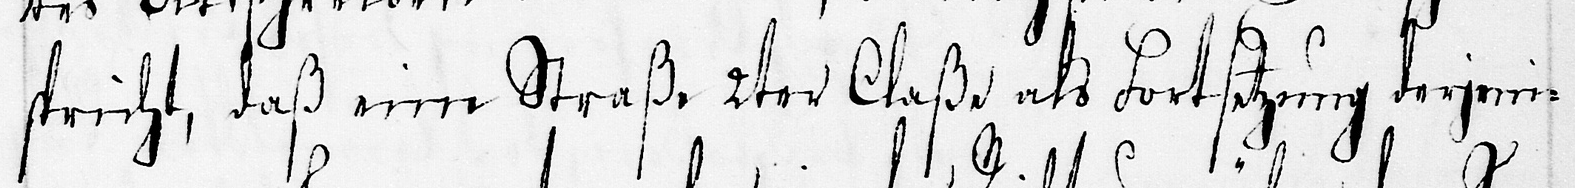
spricht, daß eine Straße 2ter Claße als Fortsetzung derjeni¬
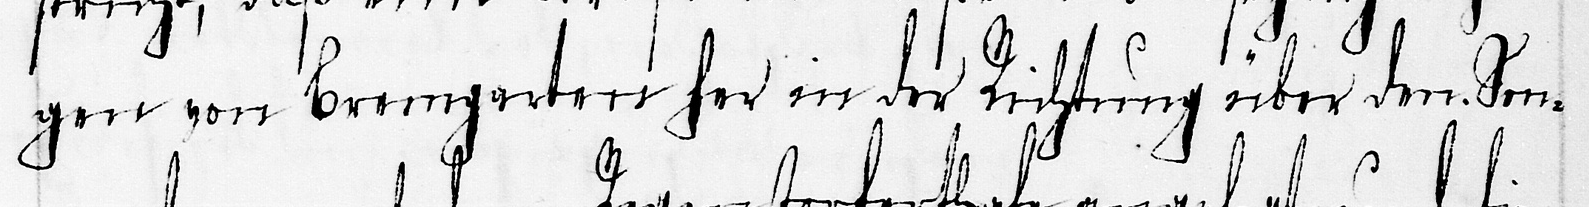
gen von Bremgarten her in der Richtung über den Sen¬
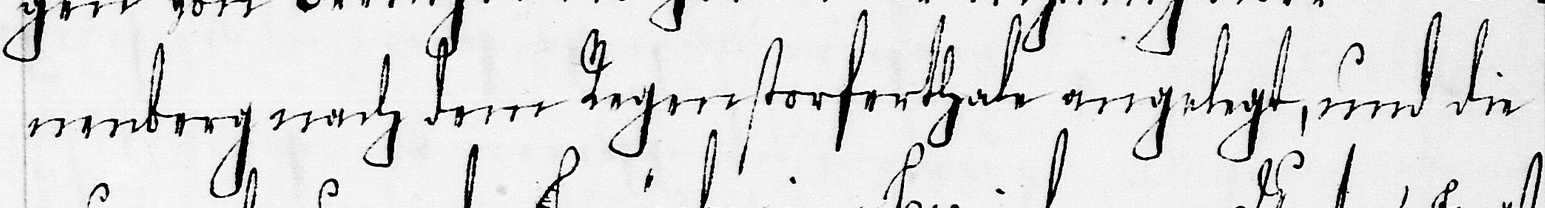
nenberg nach dem Regenstorferthale angelegt, und die
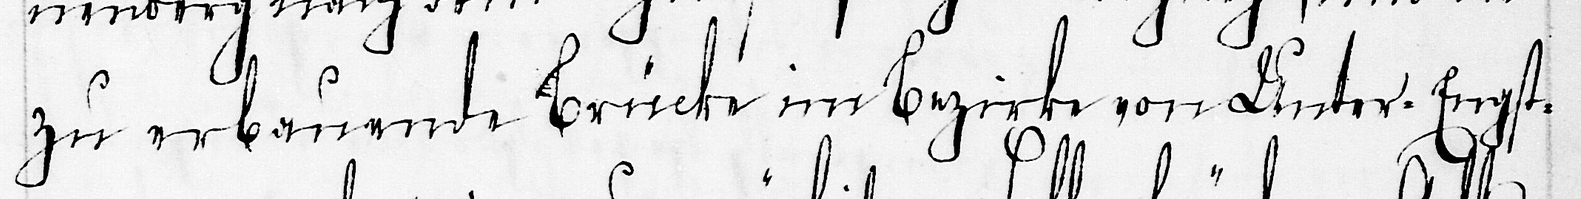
zu erbauende Brücke im Bezirke von Unter-Engst¬
